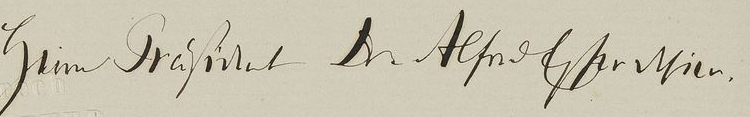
Herrn Präsident Dr. Alfred Escher dahier.
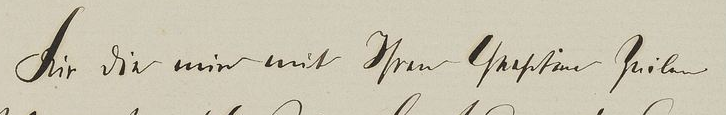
Für die mir mit Ihren Geehrten Zeilen
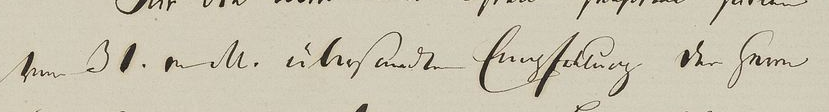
vom 31. v. M. übersandte Empfehlung des Herrn
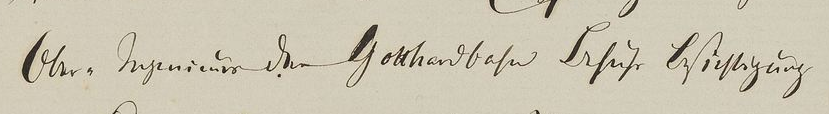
Ober-Ingenieurs der Gotthardbahn Behufs Besichtigung
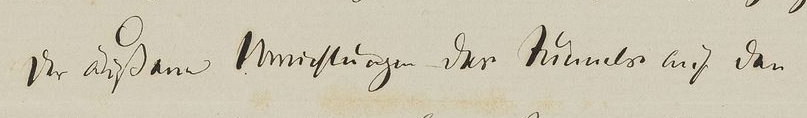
der äußern Vorrichtungen des Tunnels auf der
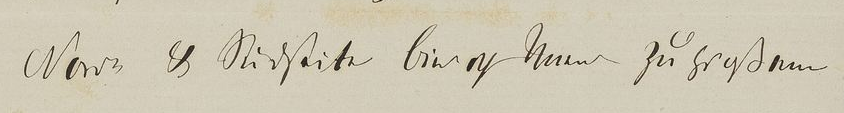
Nord & Südseite bin ich Ihnen zu großem
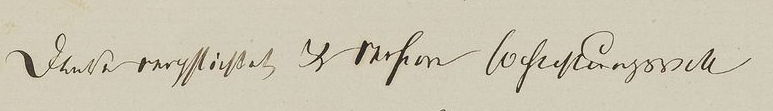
Danke verpflichtet & verhare hochachtungsvoll
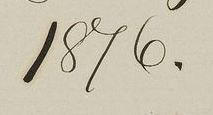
1876.
